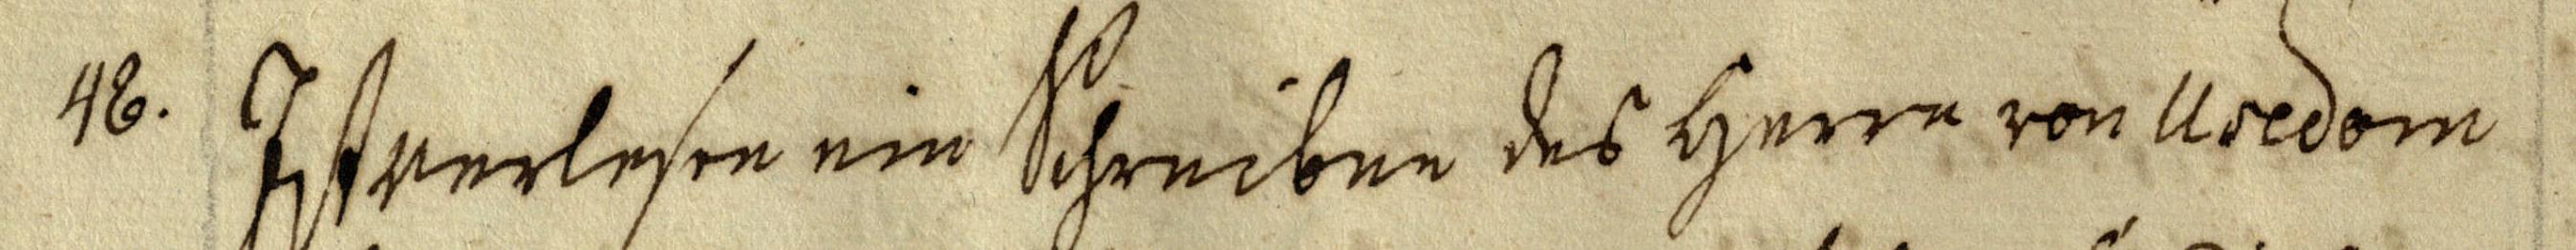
Ist verlesen ein Schreiben des Herrn von Usedom
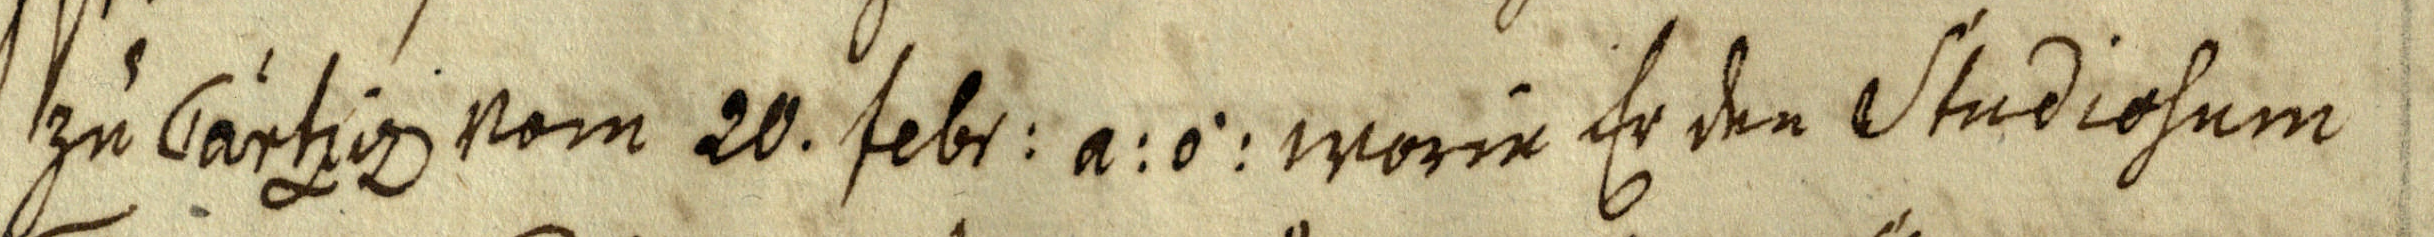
zu Cartziz vom 20. Febr. a. o. worin Er den Studiosum
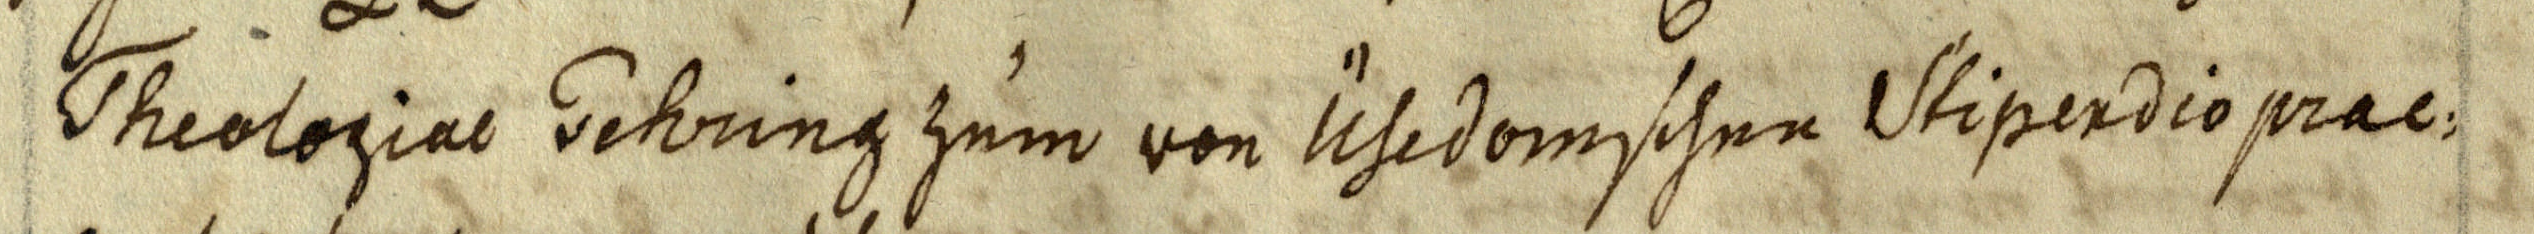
Theologiae Gehring zum von Usedomschen Stipendio prae¬
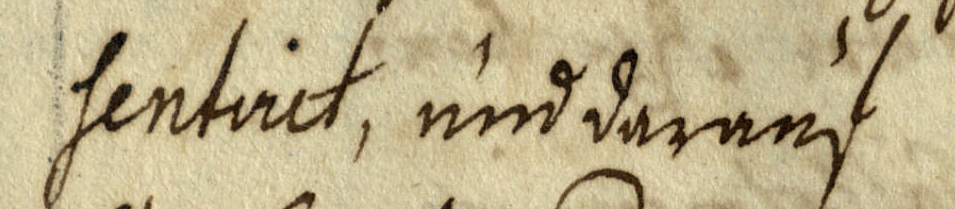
sentiret, und darauf
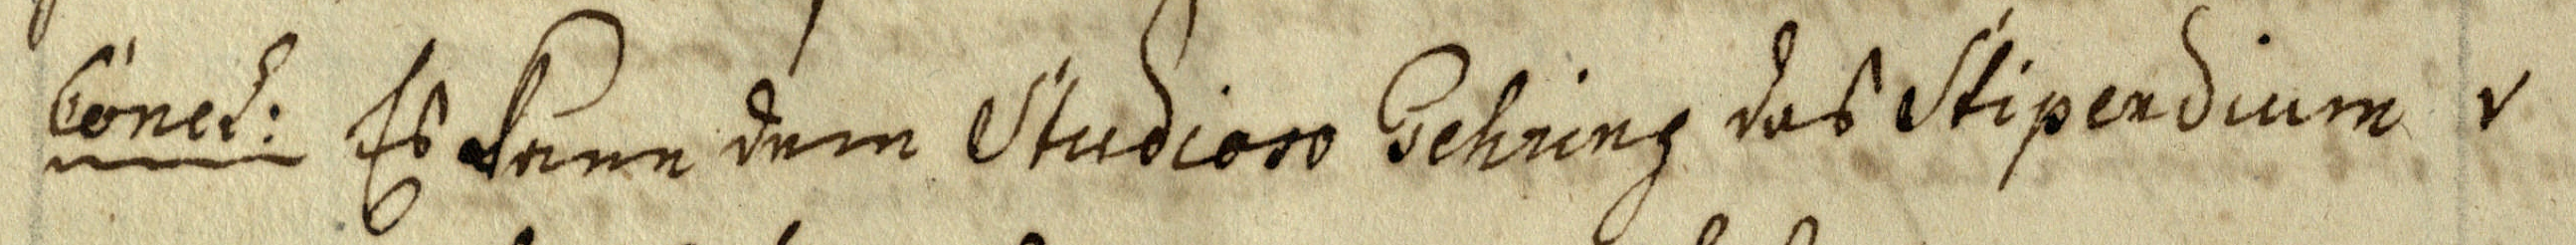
Concl. Es kann dem Studioso Gehring das Stipendium
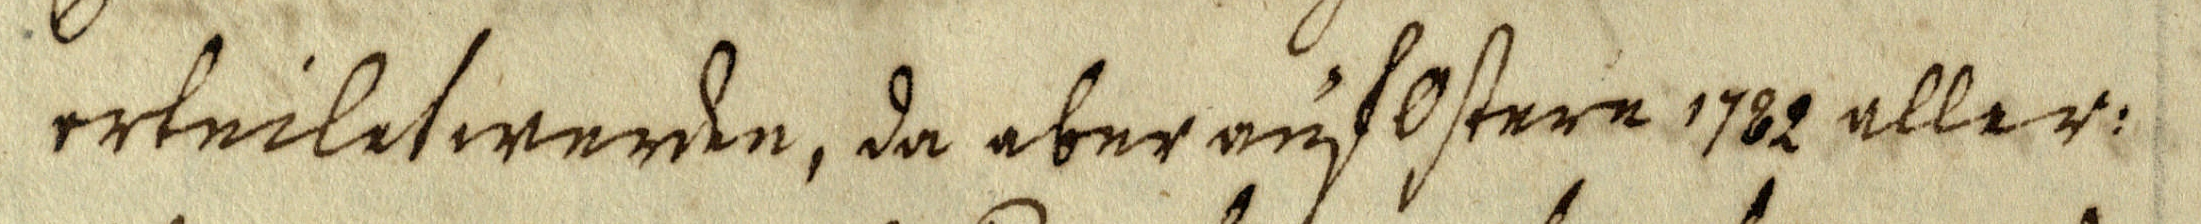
ertheilet werden, da aber auf Ostern 1782 aller¬
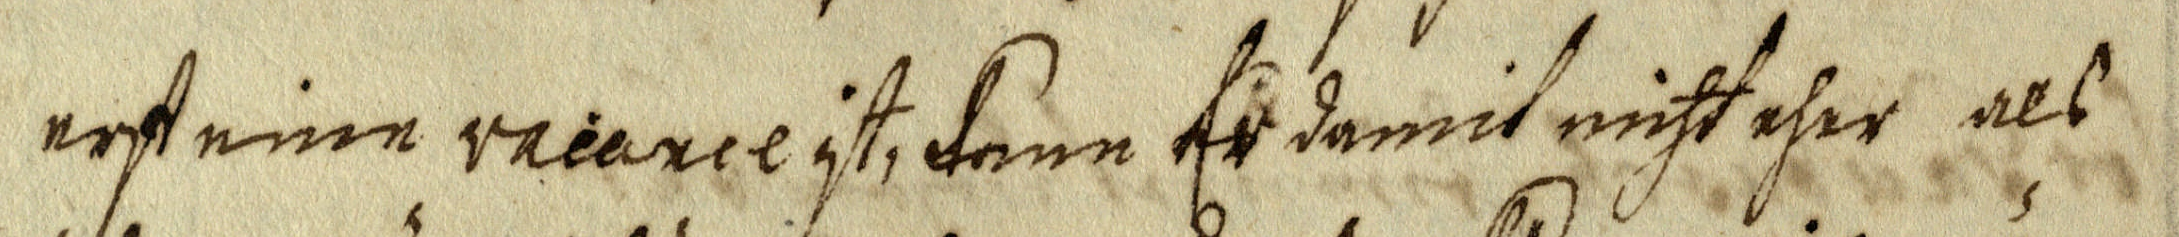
erst eine vacance ist, kann Er damit nicht eher als
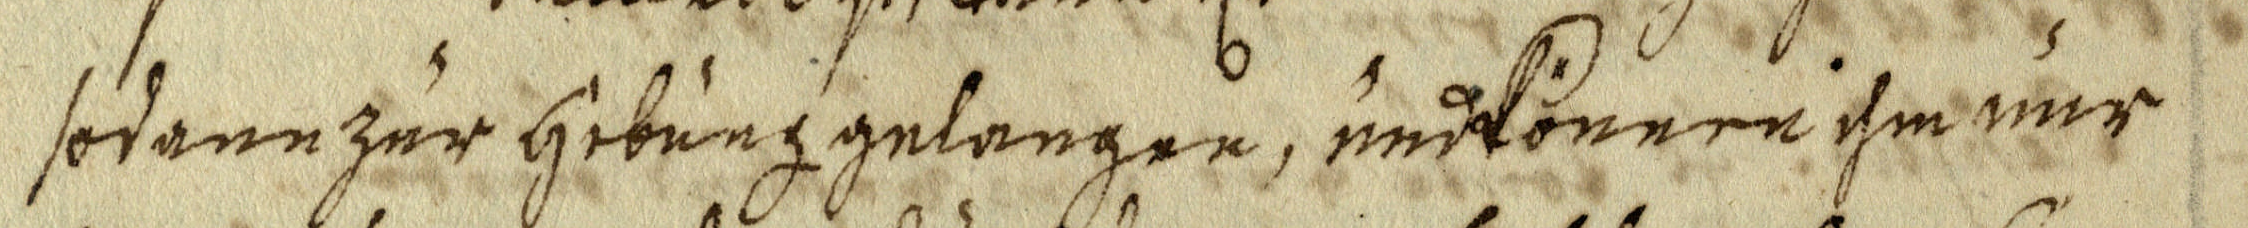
sodann zur Hebung gelangen, und können ihm nur
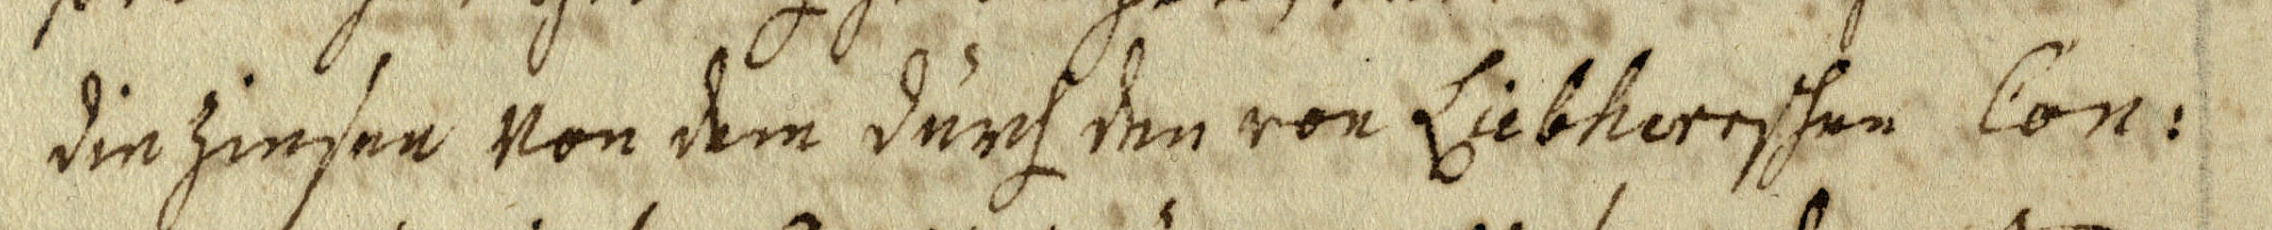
die Zinsen von dem durch den Liebherrschen Con¬
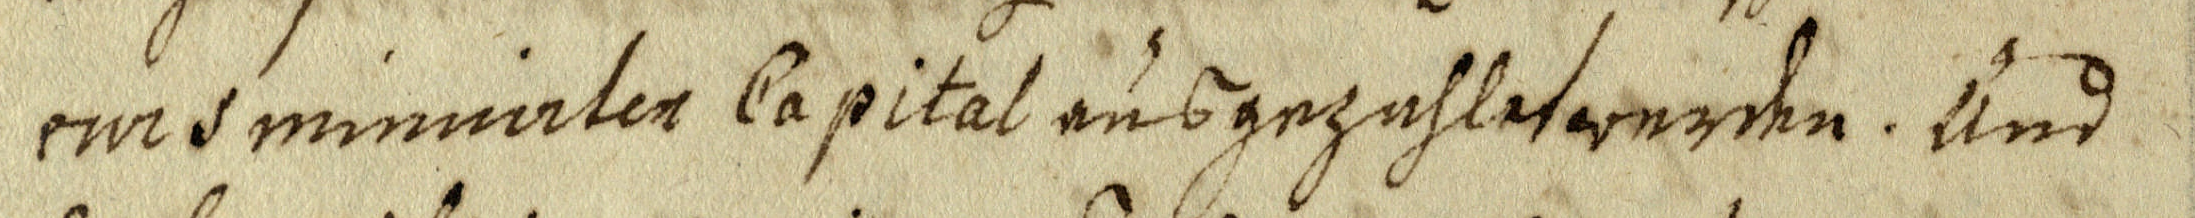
curs minnirten Capital ausgezahlet werden. Und
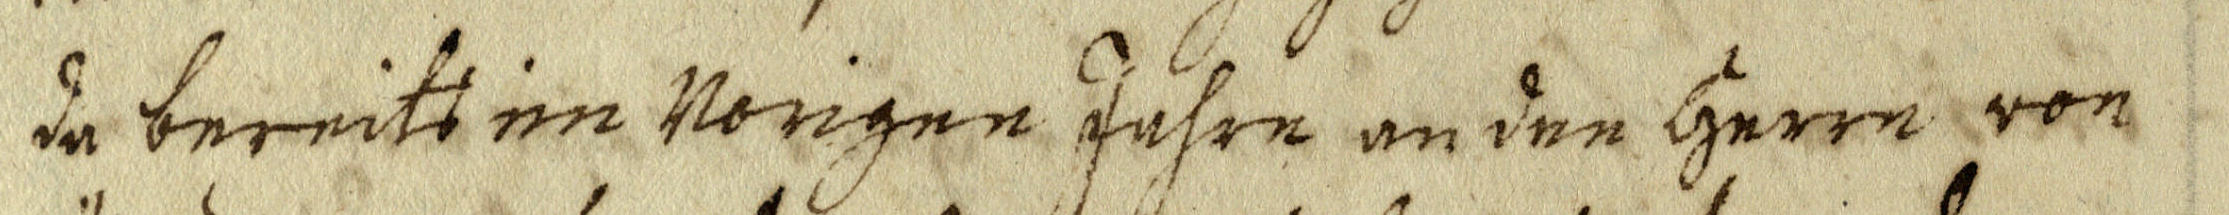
da bereits im vorigen Jahre an den Herrn von
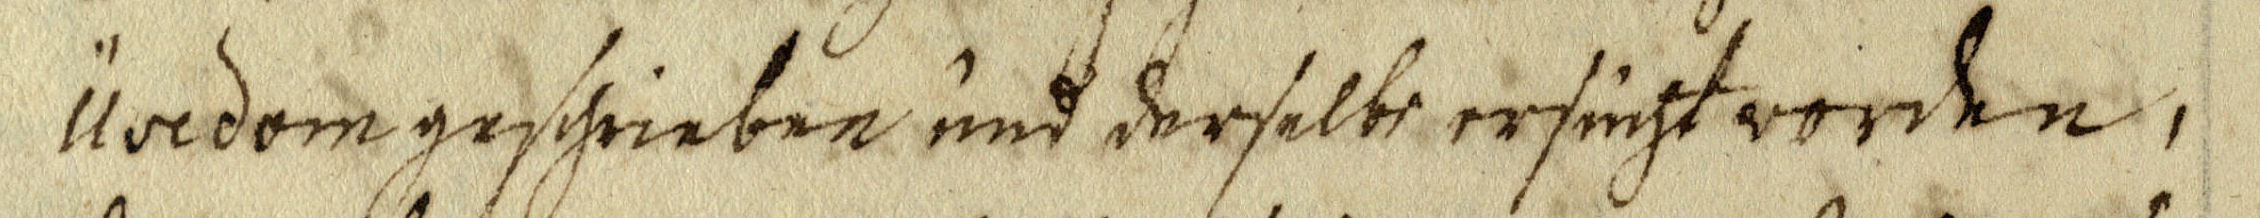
Usedom geschrieben und derselbe ersucht worden,
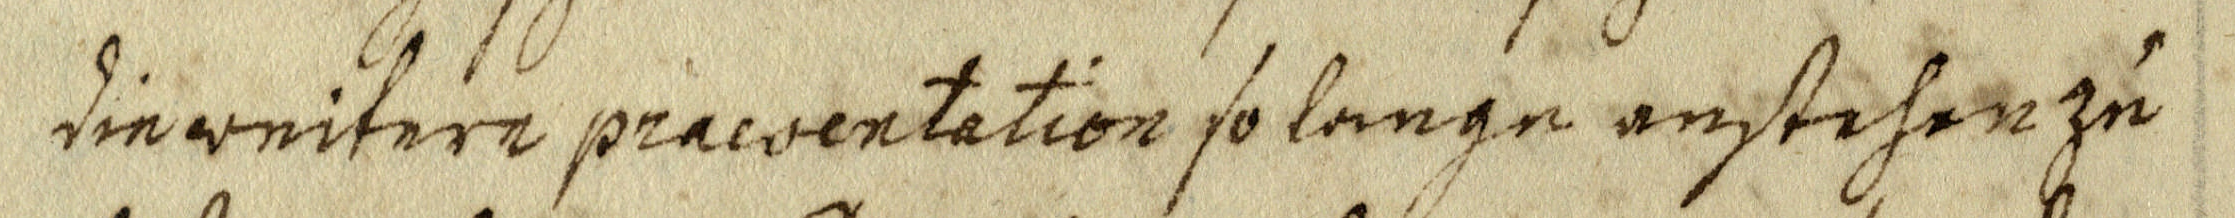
die weitere praesentation so lange anstehen zu
